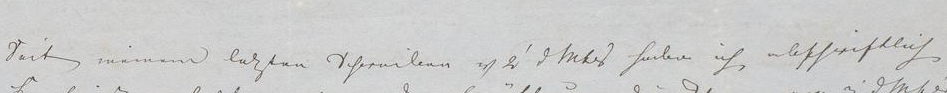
Seit meinem letzten Schreiben v 2t dMts habe ich abschriftlich
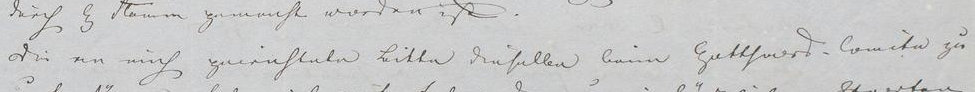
Die an mich gerichtete Bitte dieselbe beim Gotthard-Comite zu
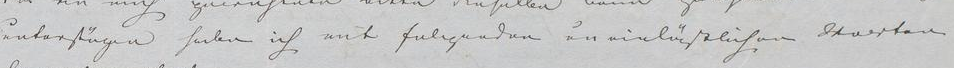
unterstüzen habe ich mit folgenden uneinläßlichen Worten
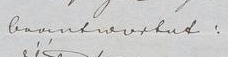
beantwortet:
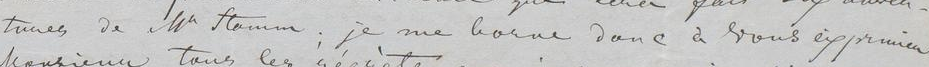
tures de MrStamm; je me borne donc à Vous éxprimer
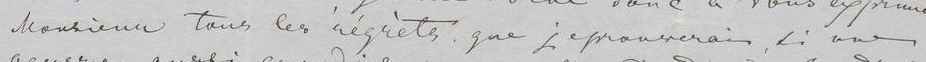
Monsieur tous les régrèts, que j'eprouverais, si une
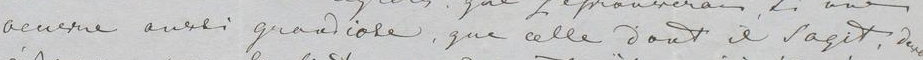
oeuvre aussi grandiose, que celle dont il s'agit, devrait
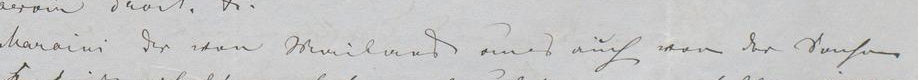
Maraini der von Mailand aus auch von der Sache
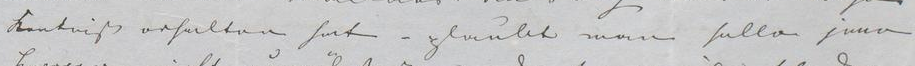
Kentniß erhalten hat, glaubt man solle jene
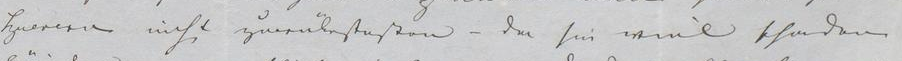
Herrn nicht zurükstoßen, da sie viel schaden
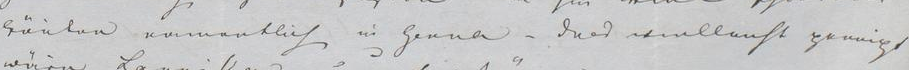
könnten namentlich in Genua, das vielleicht geneigt
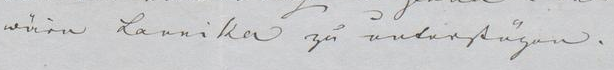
wäre Lannika zu unterstüzen. –
